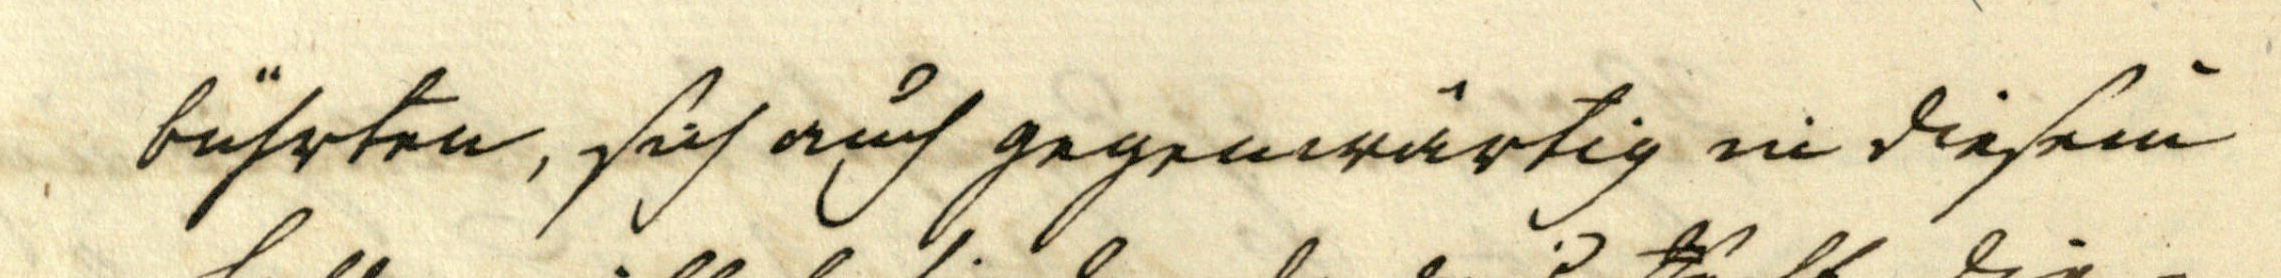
bührten, sich auch gegenwärtig in diesem
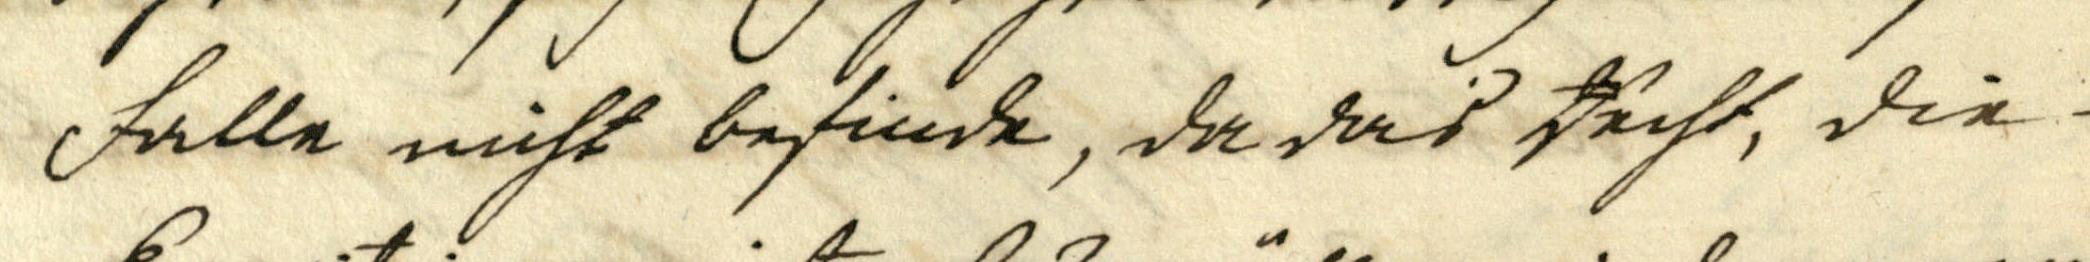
Falle nicht befinde, da das Recht, die
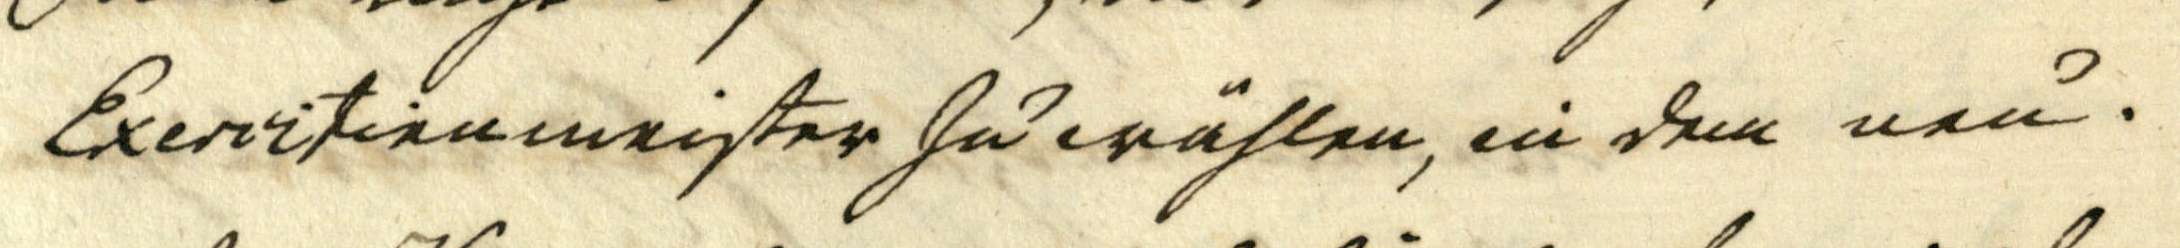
Exercitienmeister zu wählen, in dem neu¬
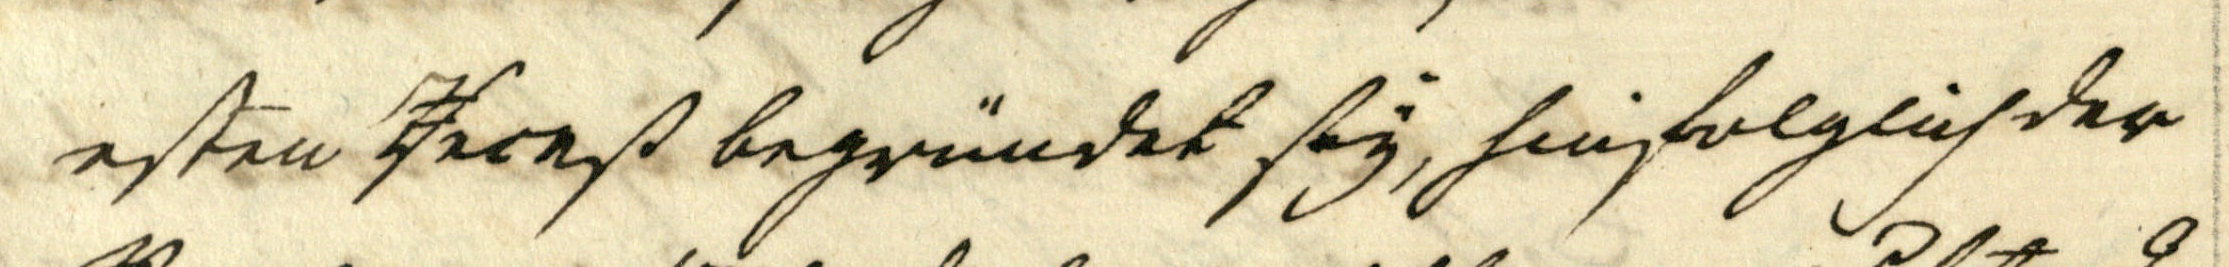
esten Receß begründet seÿ, hinfolglich der
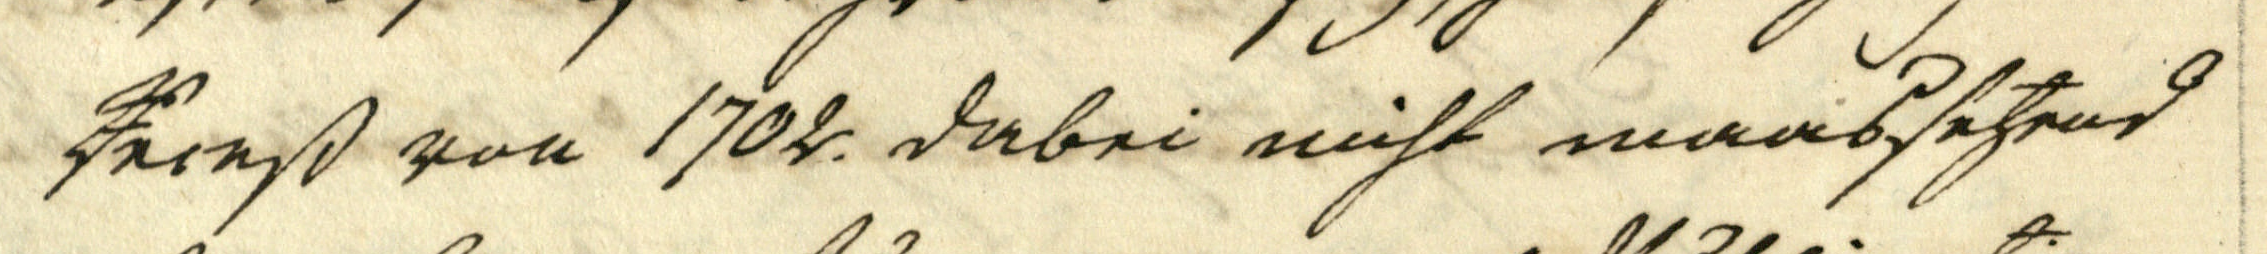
Receß von 1702. dabei nicht maassetzend
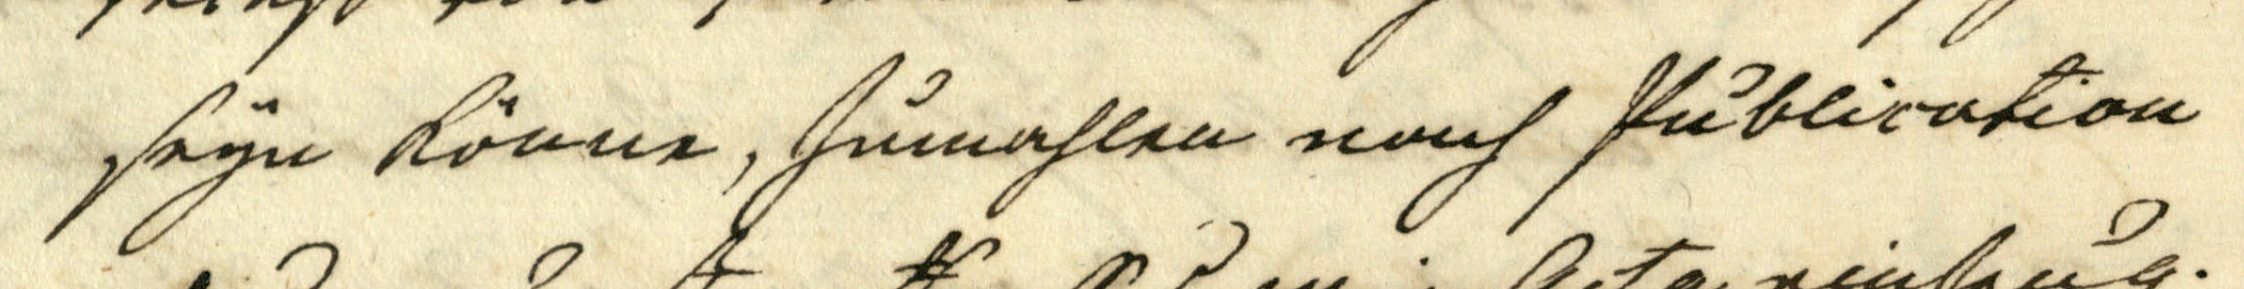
seÿn könne, zumahlen nach Publication
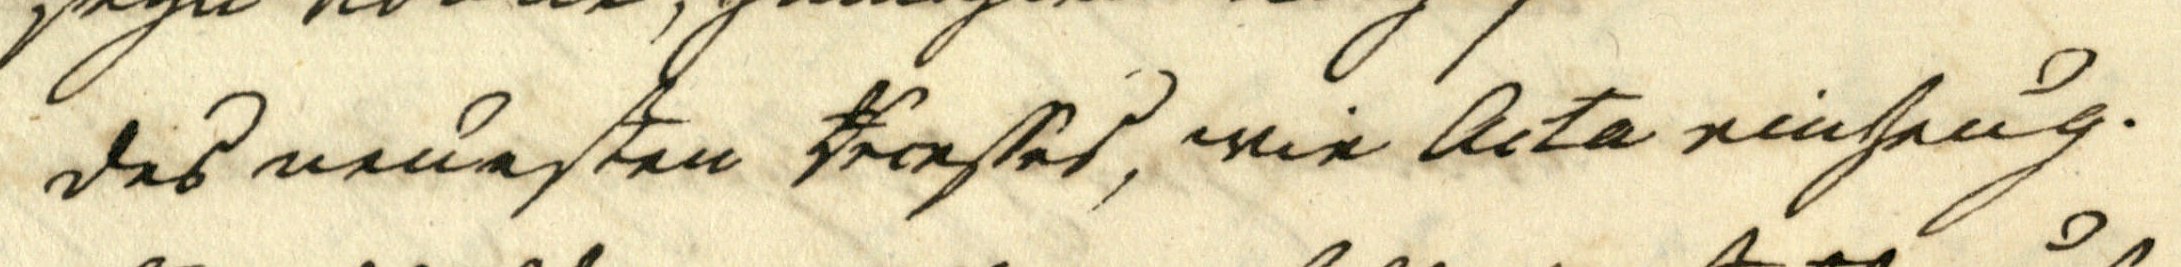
des neuesten Recesses, wie Acta einzeug¬
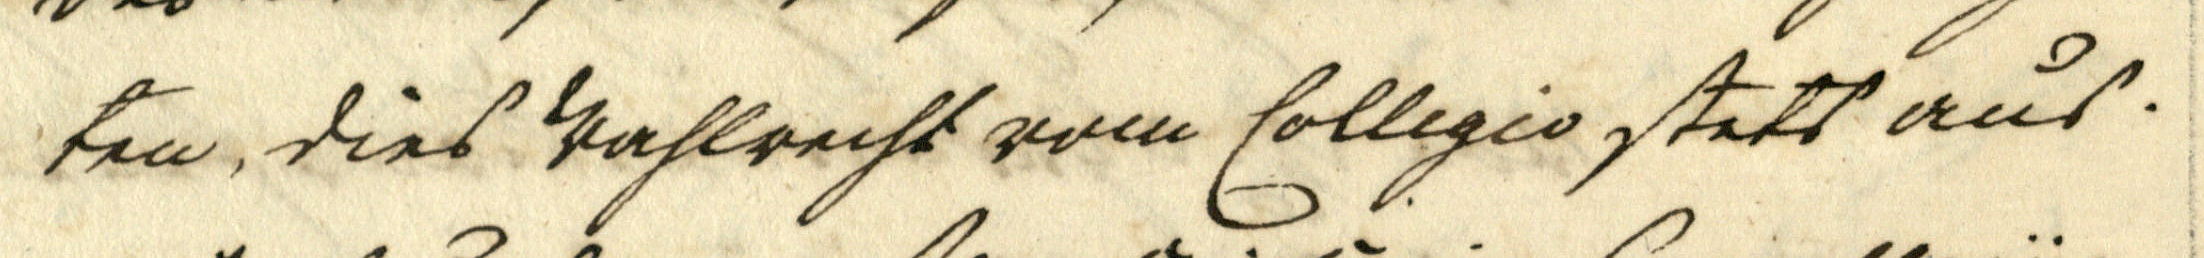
ten, dies Wahlrecht vom Collegio stets aus¬
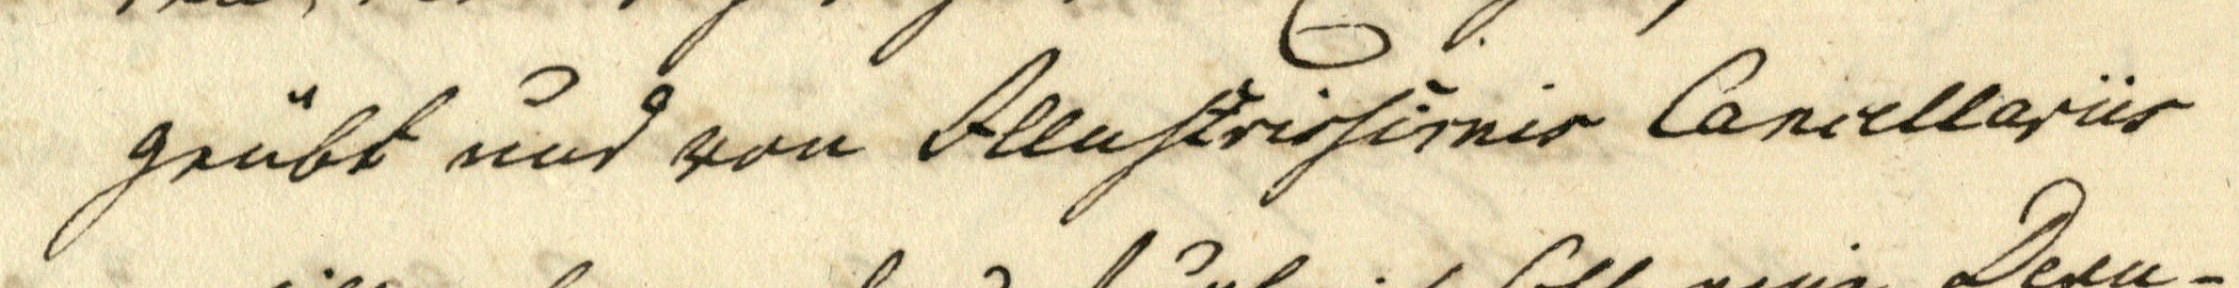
geübt und von Illustrissimis Cancellariis
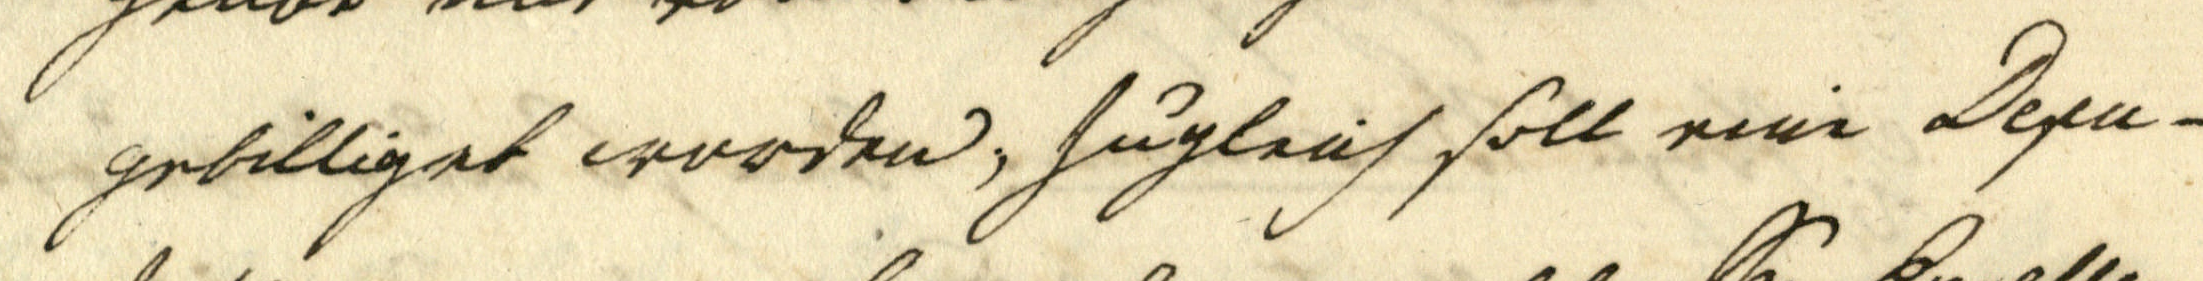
gebilliget worden, zugleich soll eine Depu¬
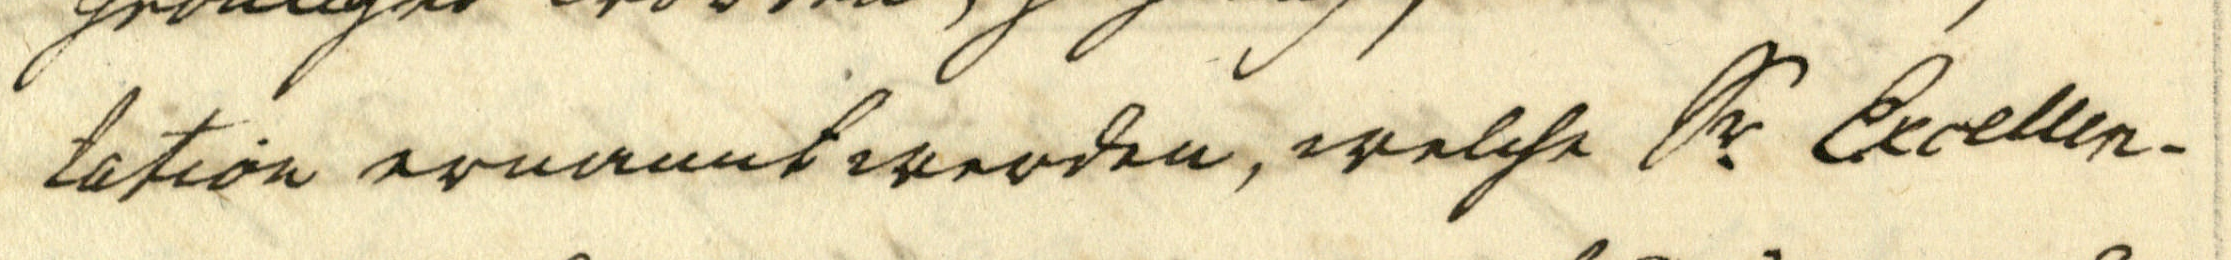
tation ernannt werden, welche Sr Excellen¬
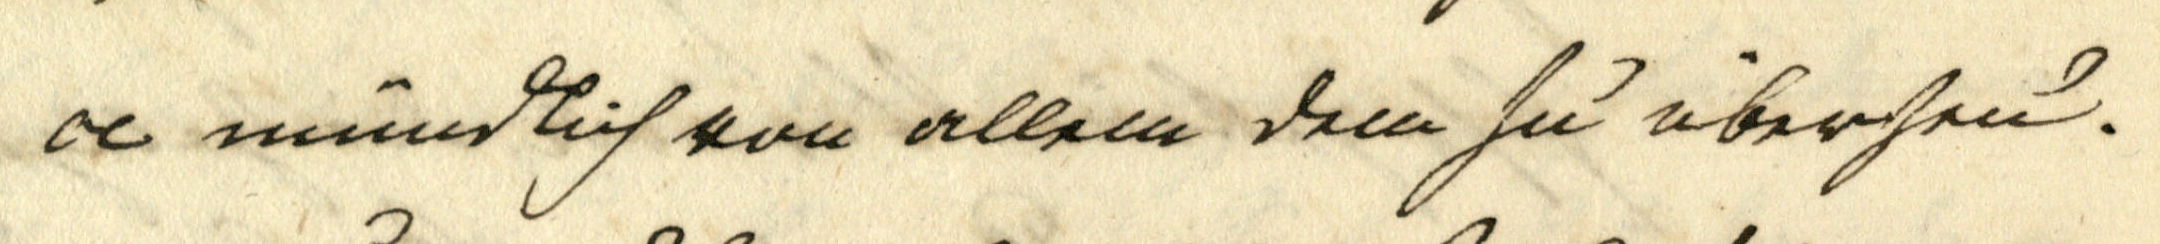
ce mündlich von allem dem zu überzeu¬
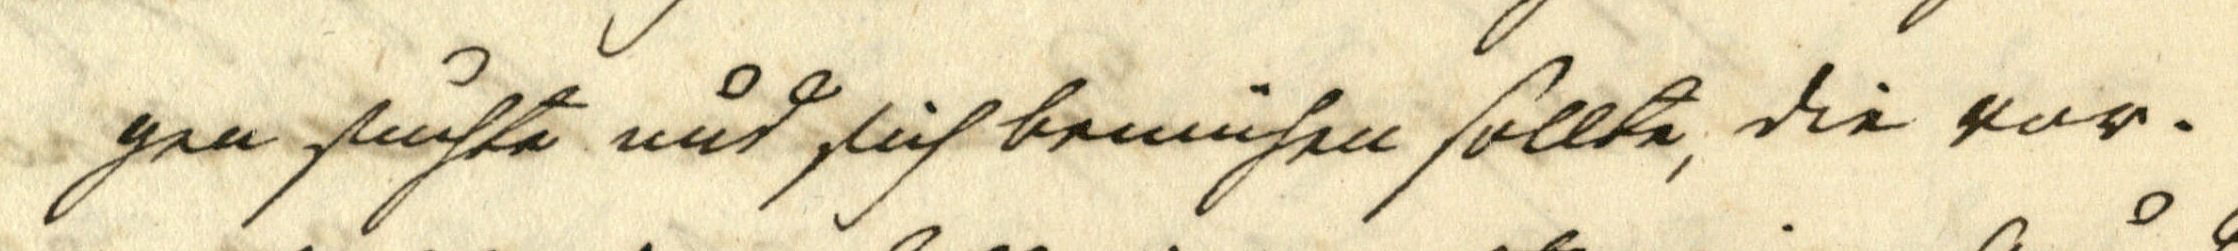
gen suchte und sich bemühen sollte, die vor¬
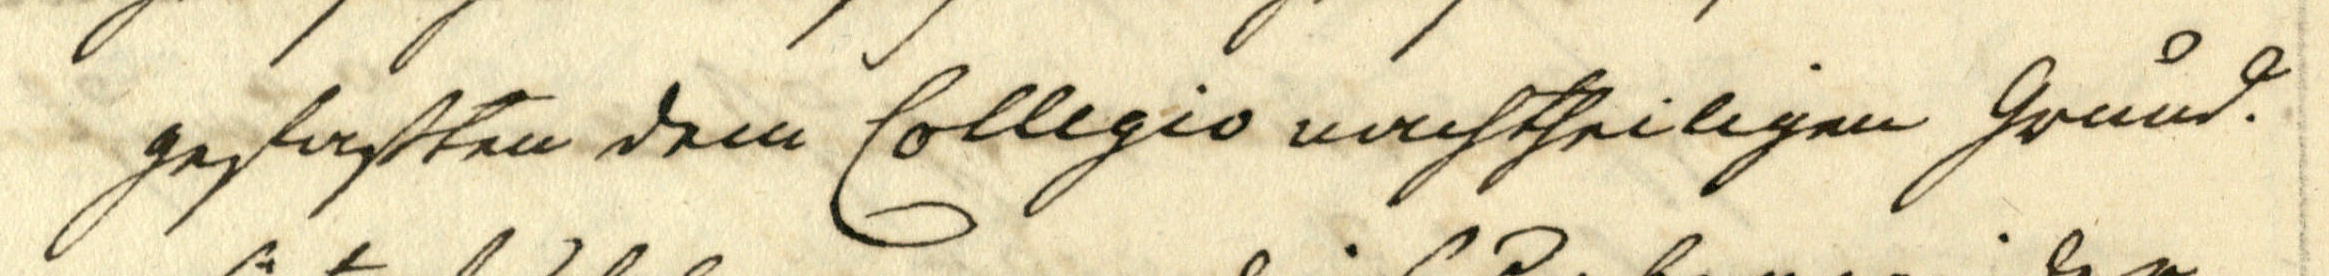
gefaßten dem Collegio nachtheiligen Grund¬
